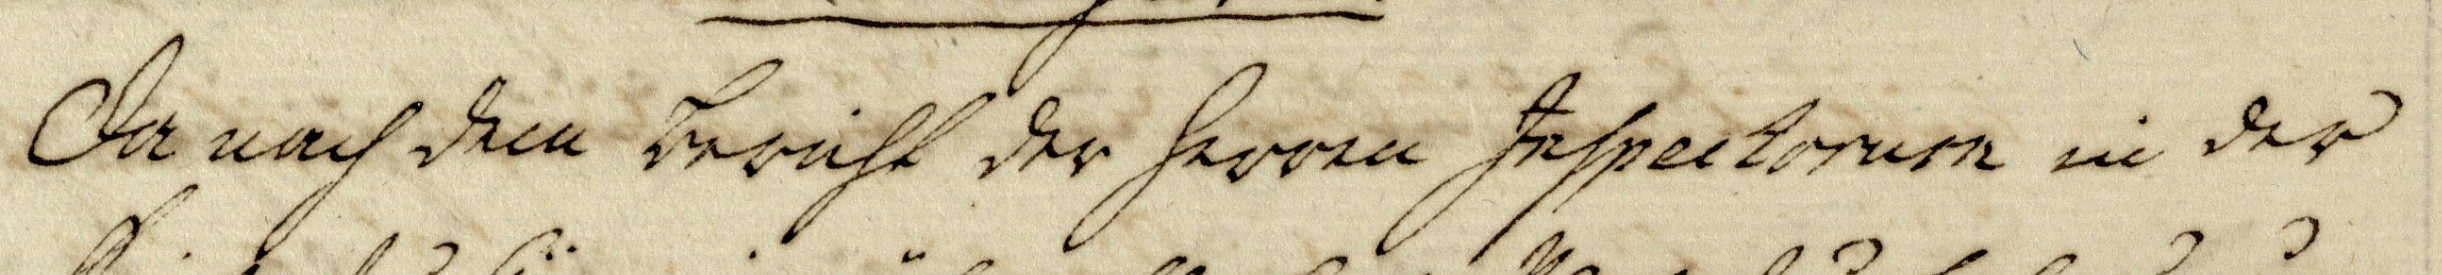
Da nach dem Bericht der Herren Inspectorum in der
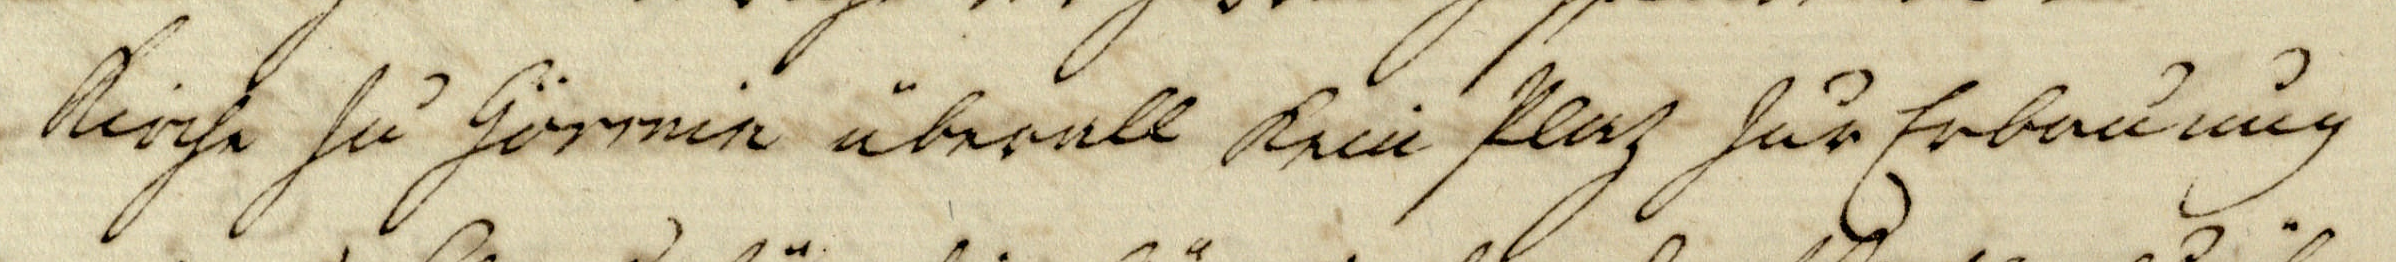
Kirche zu Görmin überall kein Platz zur Erbauung
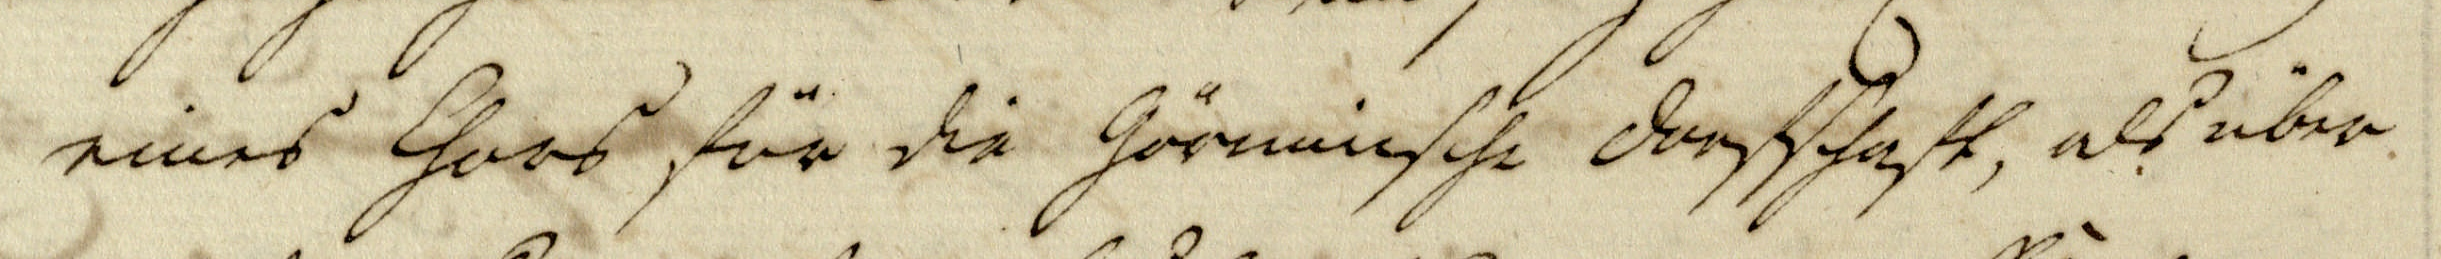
eines Chors für die Görminsche Dorfschaft, als über
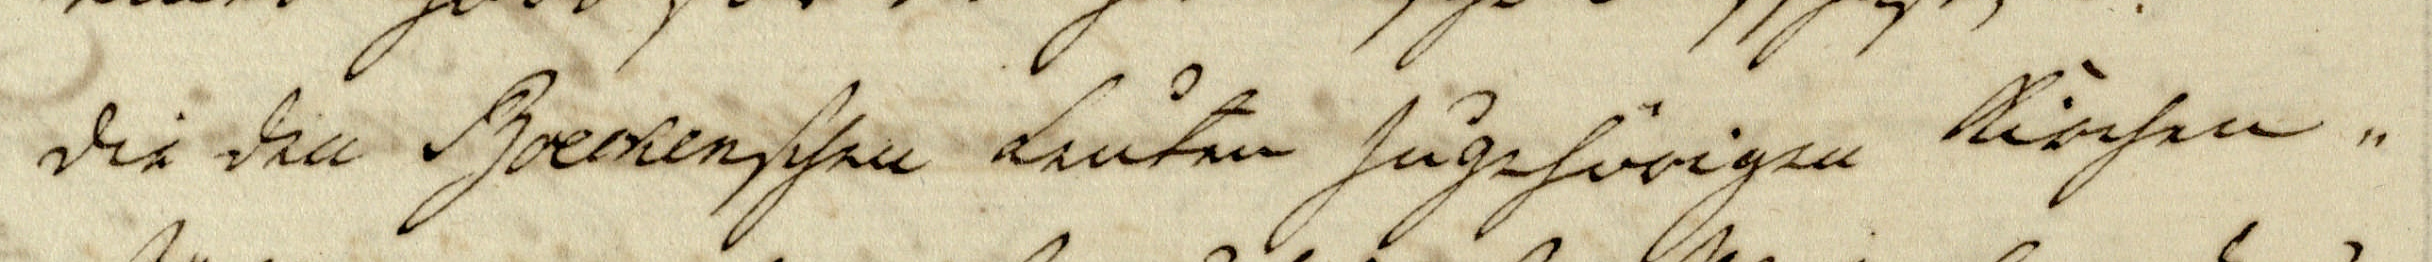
die den Boeckenschen Leuten zugehörigen Kirchen¬
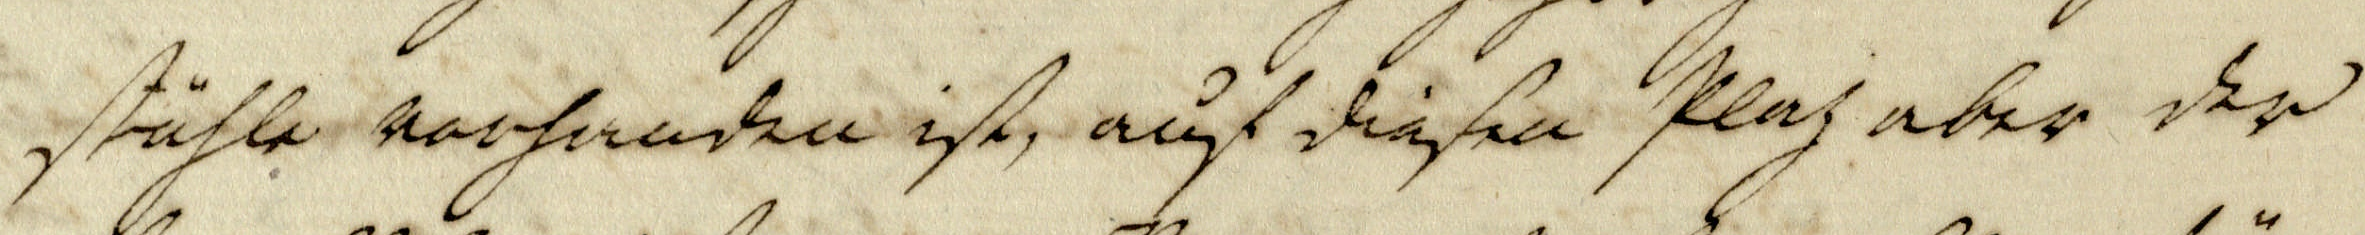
stühle vorhanden ist, auf diesen Plaz aber der
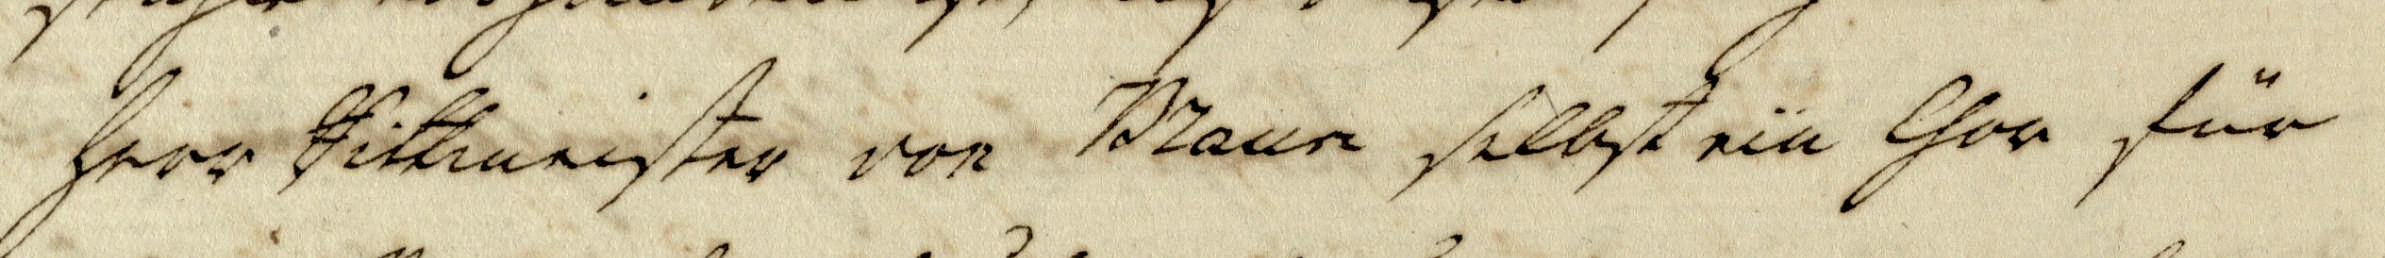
Herr Rittmeister von Maun selbst ein Chor für
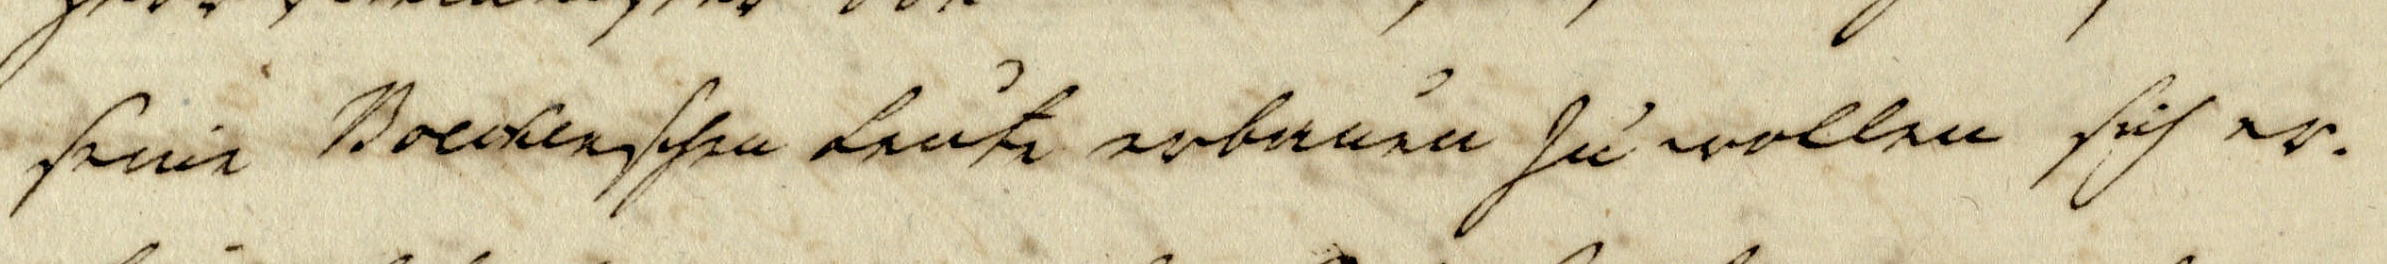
seine Boeckenschen Leute erbauen zu wollen sich er¬
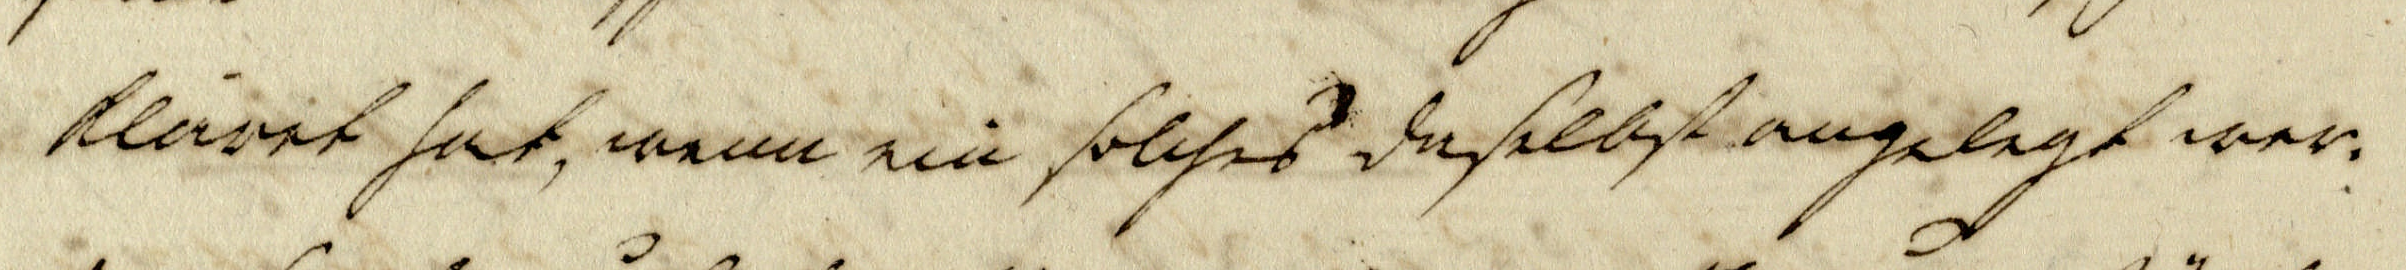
kläret hat, wenn ein solches daselbst angelegt wer¬
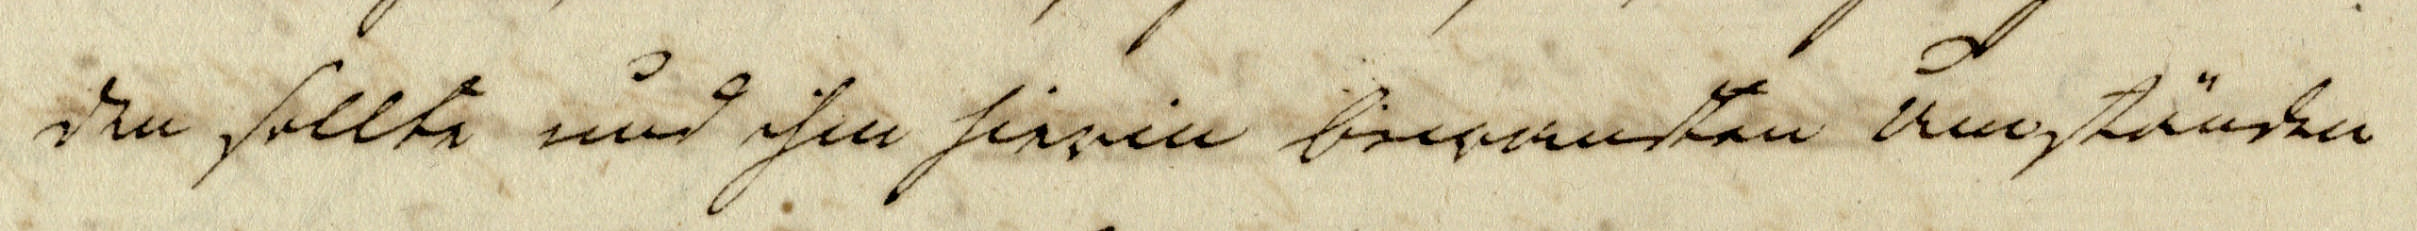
den sollte und ihm hierin bewandten Umständen
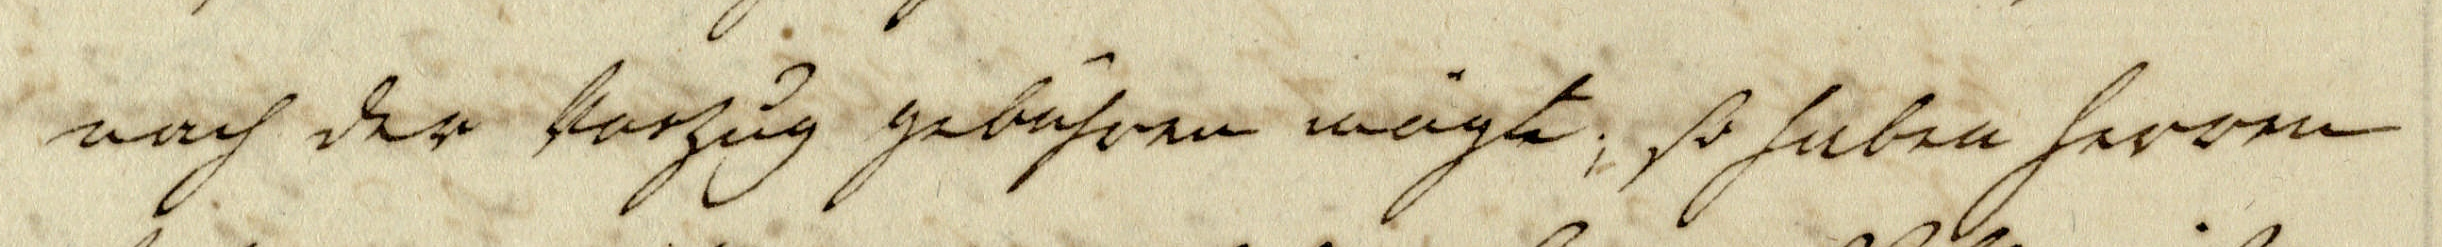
nach der Vorzug gebühren mögte; so haben Herren
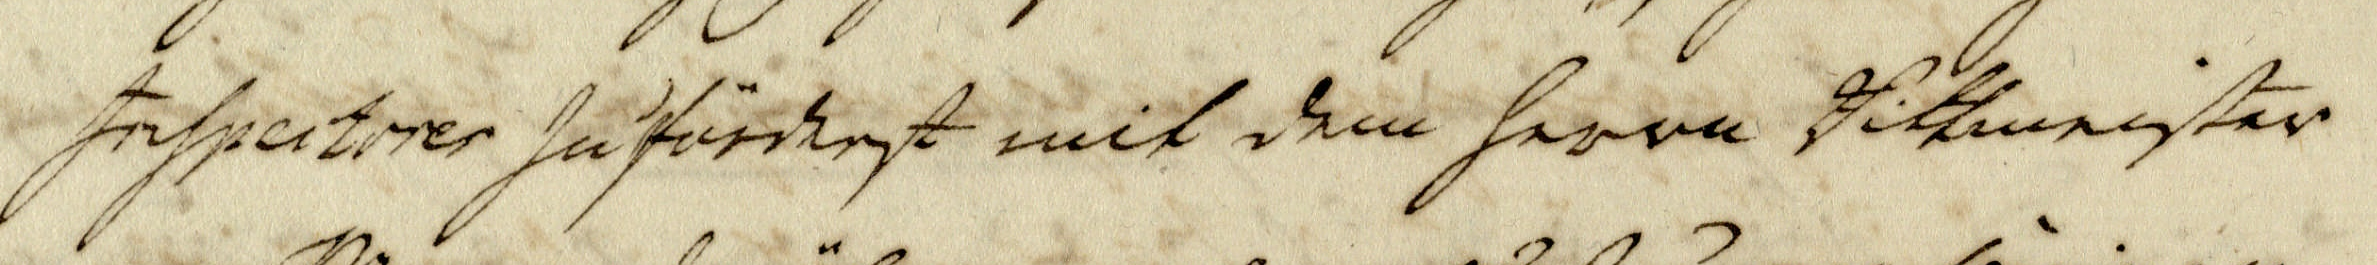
Inspectores zu förderst mit dem Herrn Rittmeister
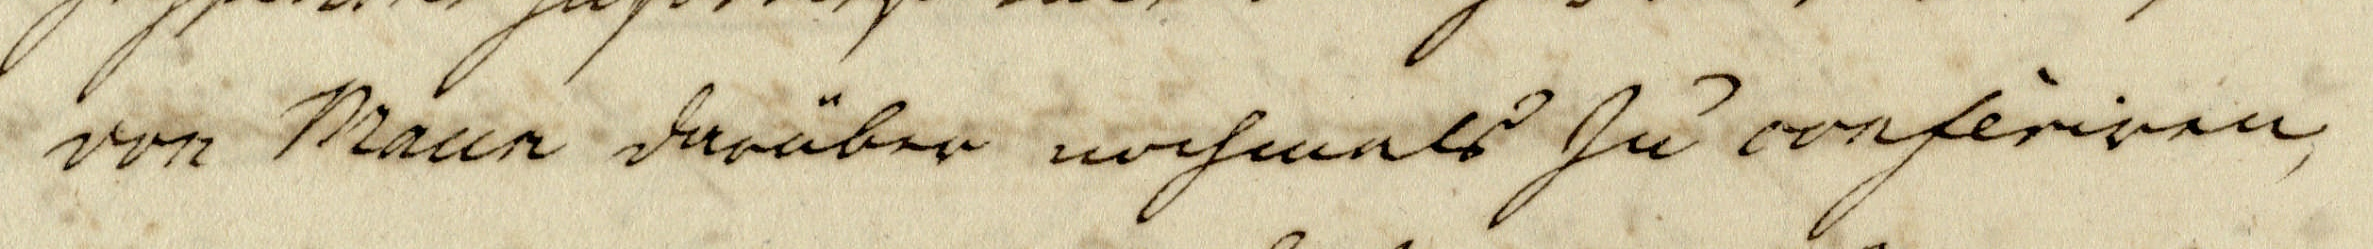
von Maun darüber nochmals zu conferiren,
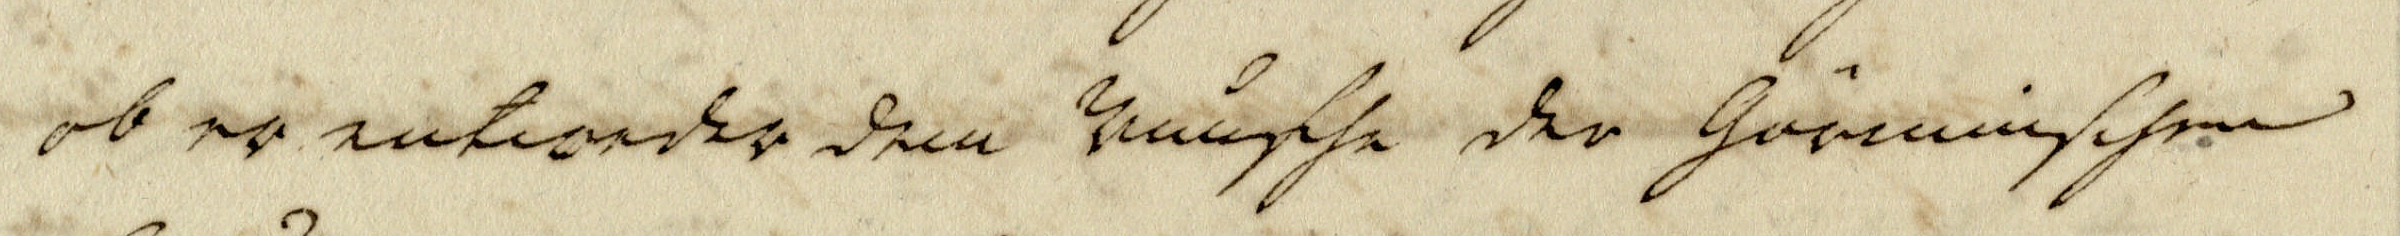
ob er entweder dem Wunsche der Görminschen
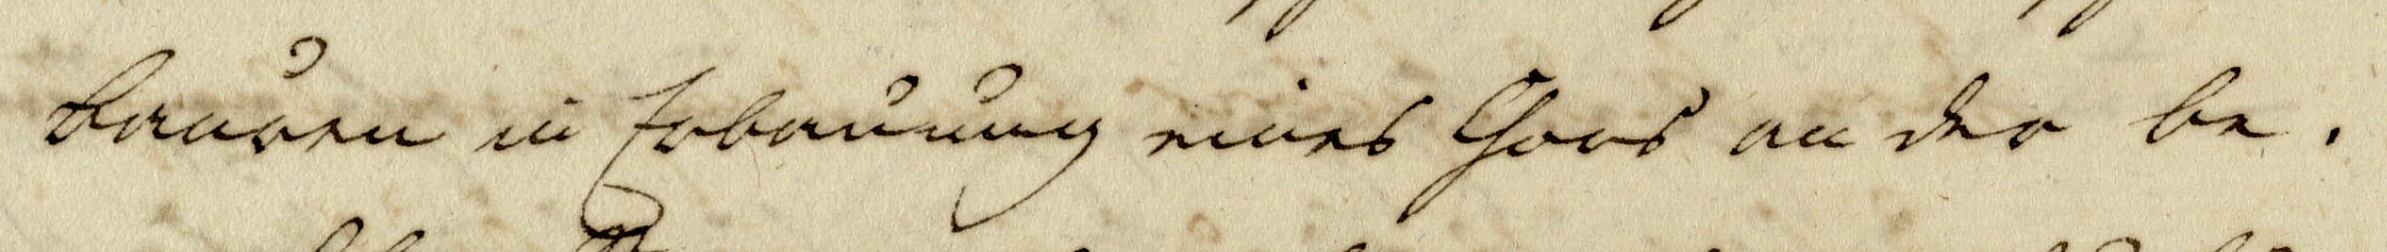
Bauren in Erbauung eines Chors an der be¬
